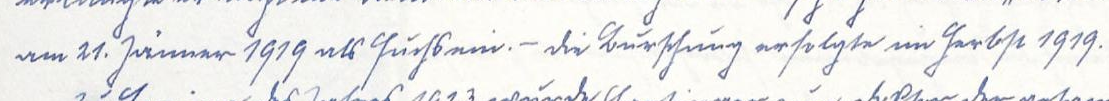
am 21. Janner 1919 als Fuchs ein.- Die Burschung erfolgte im Herbst 1919.
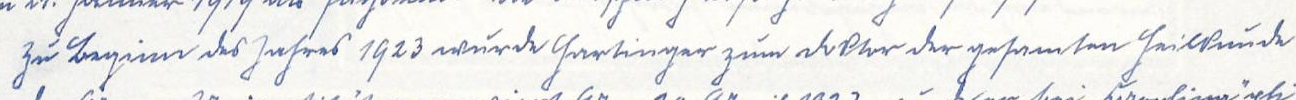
Zu Beginn des Jafres 1923 wurde Hartinger zum Doktor der gesamten Heilkunde
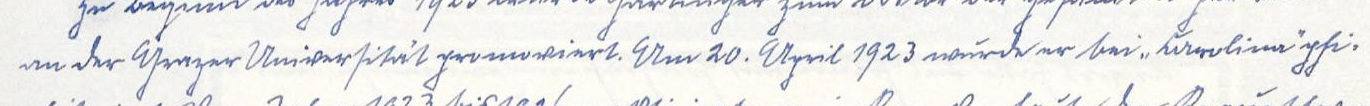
an der Grazer Universität promoviert. Am 20. April 1923 wurnde er bei "Carolina“ phi-
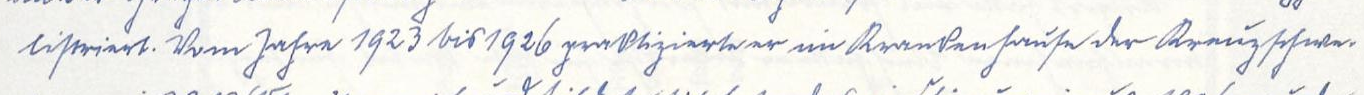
listriert. Vom Jahre 1923 bis1926 praktizierte er im Krankenhause der Kreuzschwe-
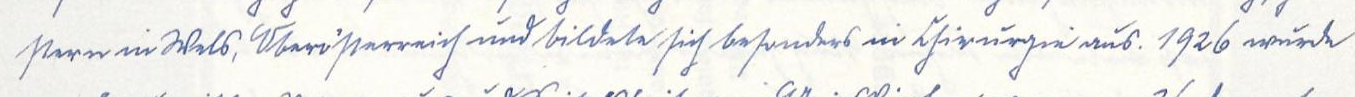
stern in Wels, Oberösterreich und bildete sich besonders in Chirurgie aus. 1926 wurde
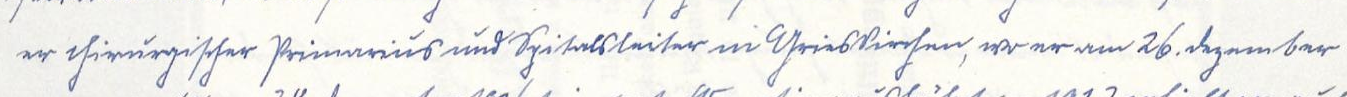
er chirurgischer Primarius und Spitalsleiter in Grieskirchen, wo er am 26. Dezember
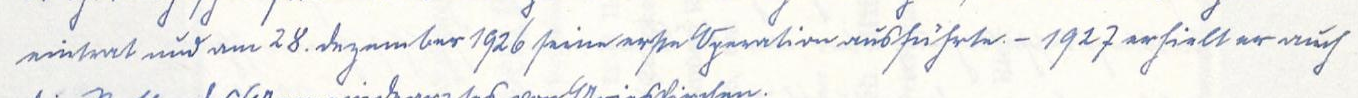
eintrat und am 28. Dezember 1926 seine erste Operation ausführte.- 1927 erhielt er auch
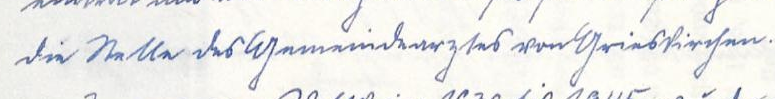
die Stelle des Gemeindearztes von Grieskirchen.
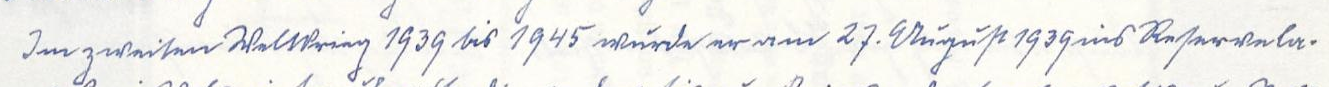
In zweiten Weltkrieg 1939 bis 1945 wurde er am 27. August 1939 ins Reservela-
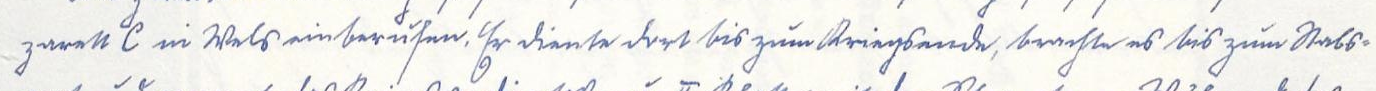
zarett C in Wels einberufen. Er diente dort bis zum Kriegsende, brachte es bis zum Stabs-
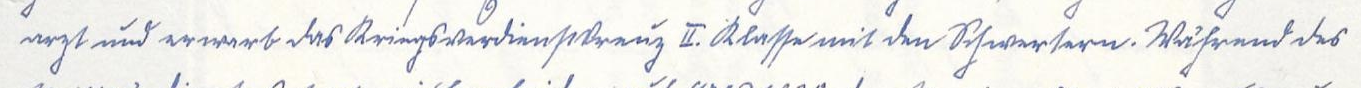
arzt und erwarb das Kriegsverdienstkreuz II. Klasse mit den Schwertern. Während des
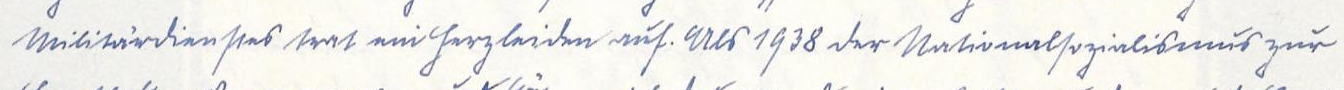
Militärdienstes trat ein Herzleiden auf. Als 1938 der Nationalsozialismus zur
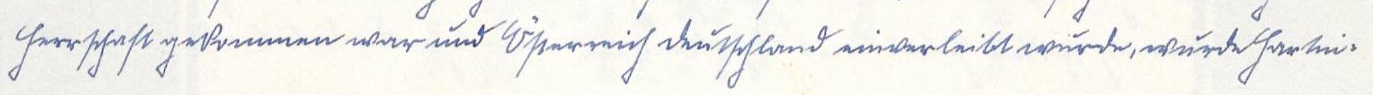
Herrschaft gekommen war und Österreich Deutschland einverleibt wurde, wurde Hartin-
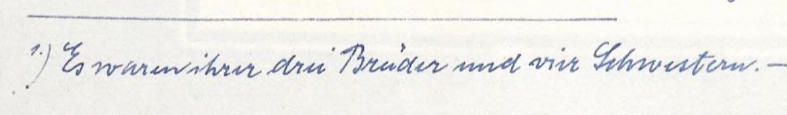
1.) Es waren ihrer drei Brüder und vier Schwestern.-
